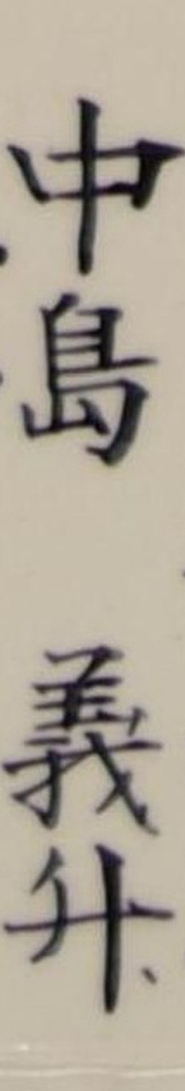中島義升
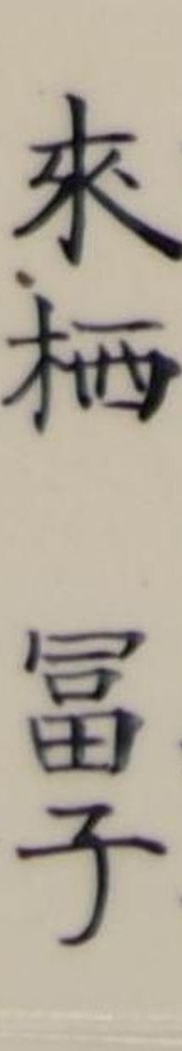来栖冨子
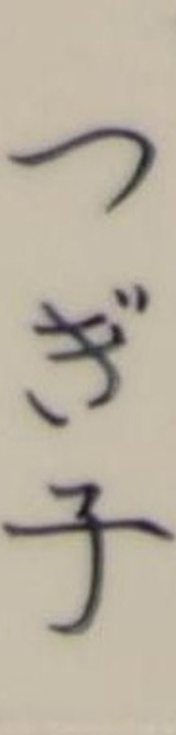つぎ子
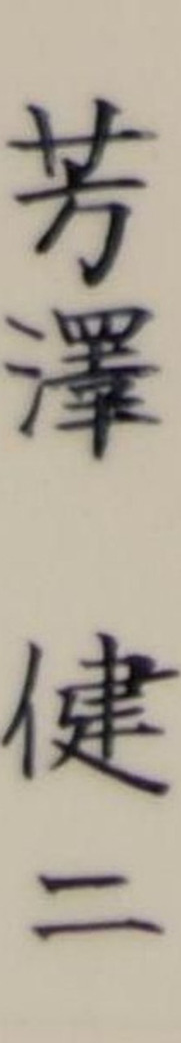芳澤健二
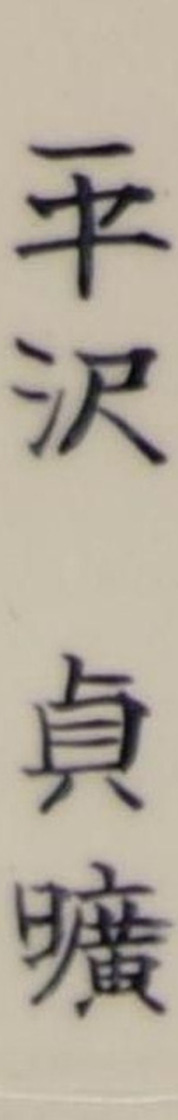平沢貞曠
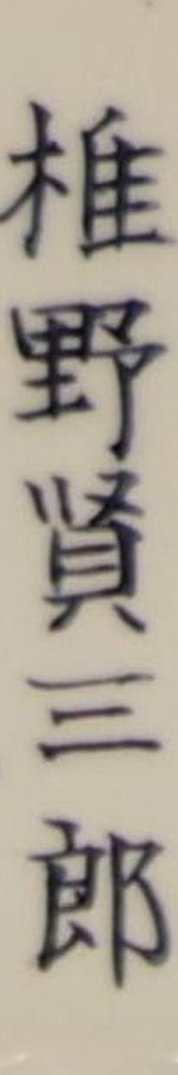椎野賢三郎
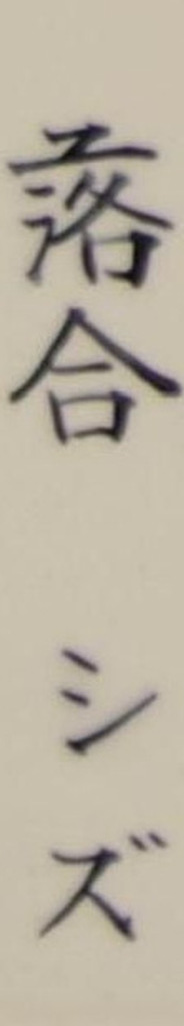落合シズ
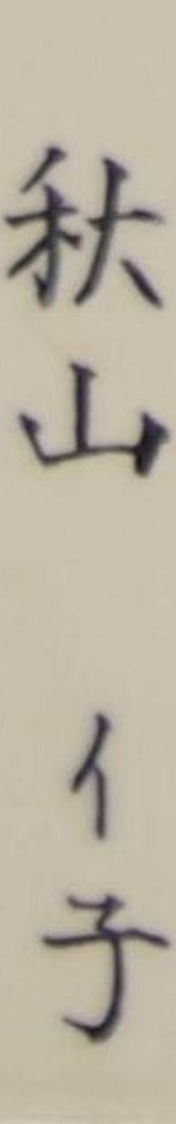秋山イ子
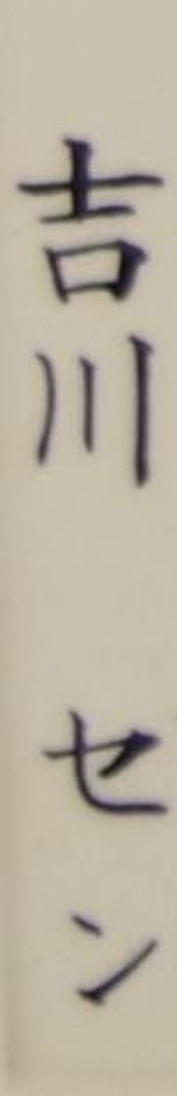吉川セン

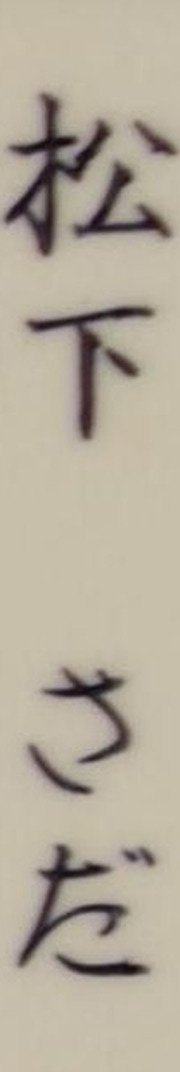松下さだ
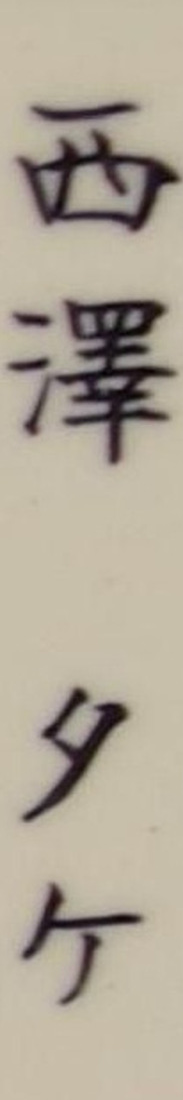西澤夕ケ
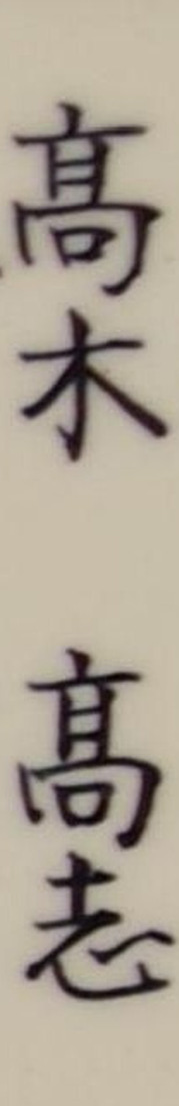高木高志
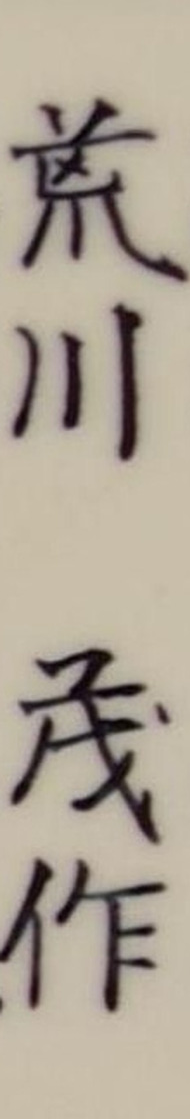荒川茂作
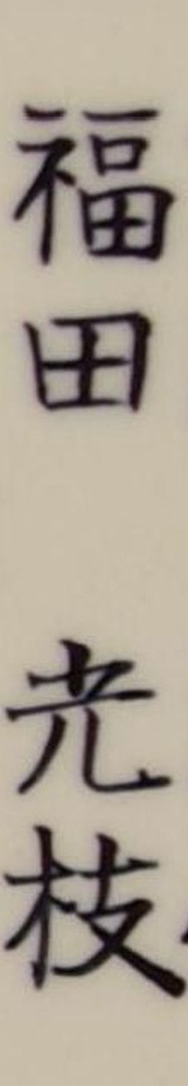福田光枝
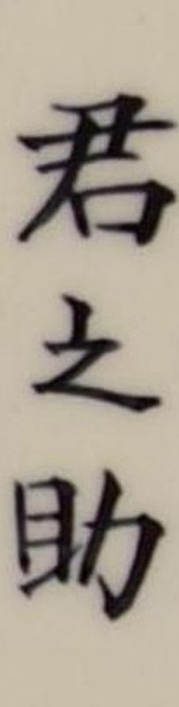君之助
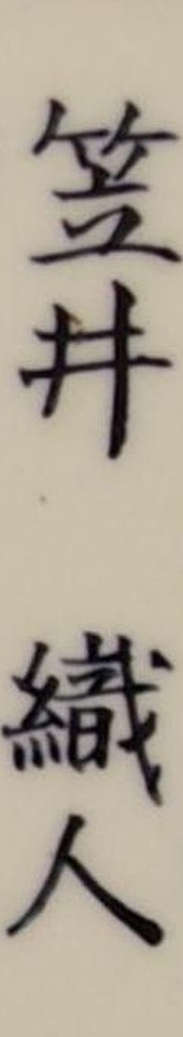笠井織人
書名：M~S
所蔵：高野山金剛峯寺
